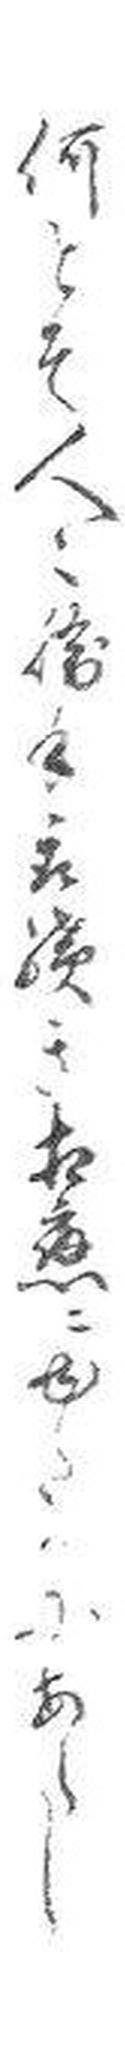何とそ人々勝手取続き相応ニゆたかにあらし
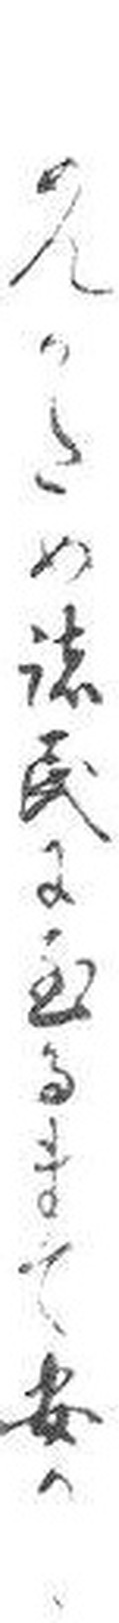めんかため諸民に至るまて安事を
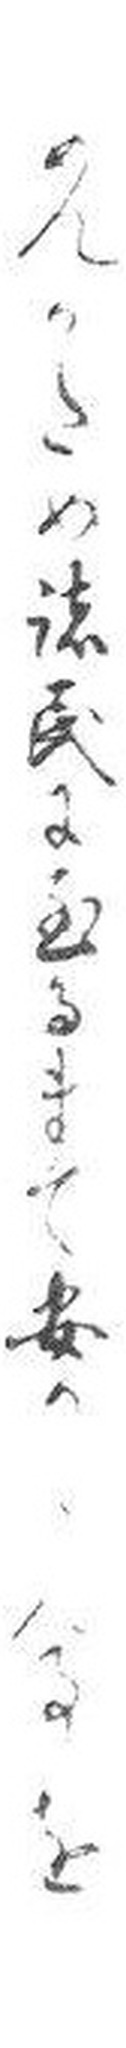めんかため諸民に至るまて安事を
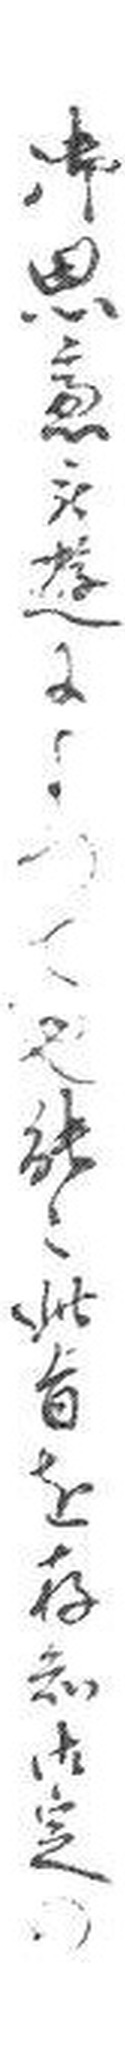御思慮被遊によつて也能々此旨を存知御定の
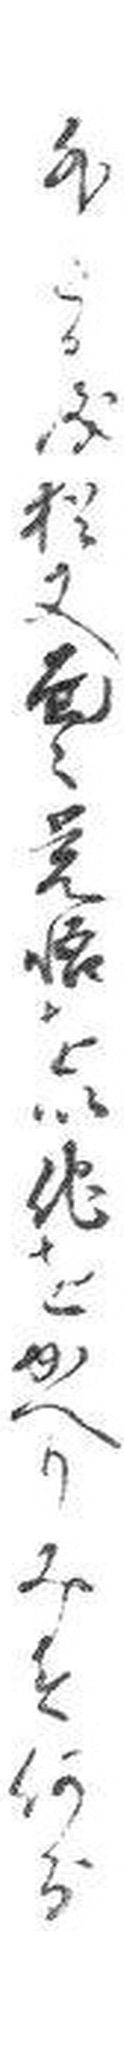外たる儀猶又面々覚悟を以他をかへりみす何分
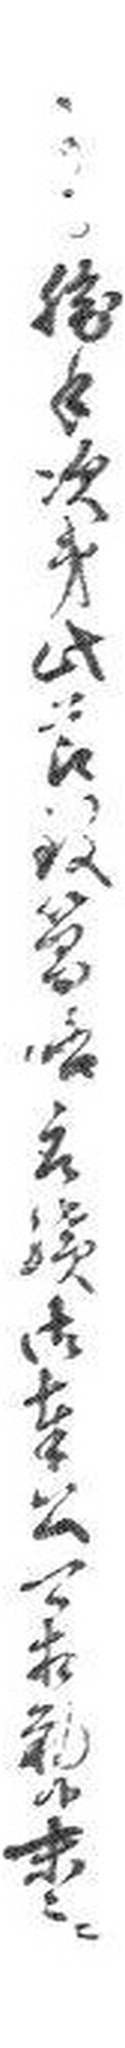にも勝手次第此節致簡略取続御奉公可相勤候末々ニ
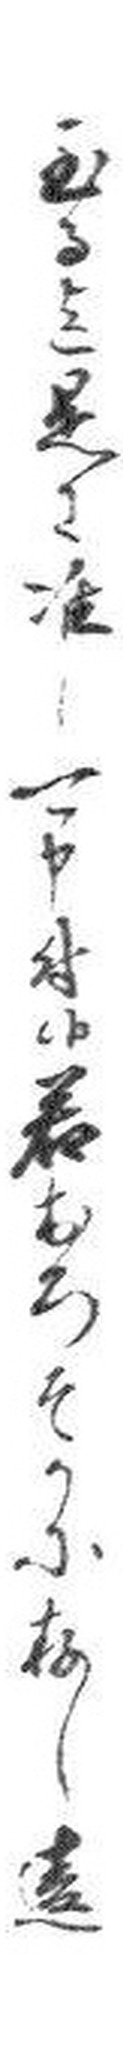至る迄是に准し可申付候若おろそかに存し違
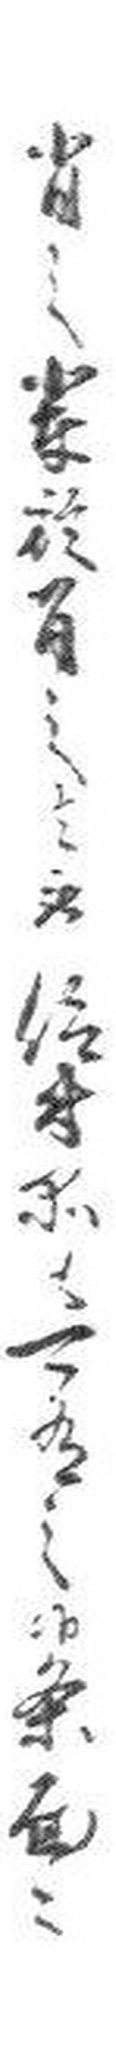背之輩於有之者被仰付品も可有候条面々
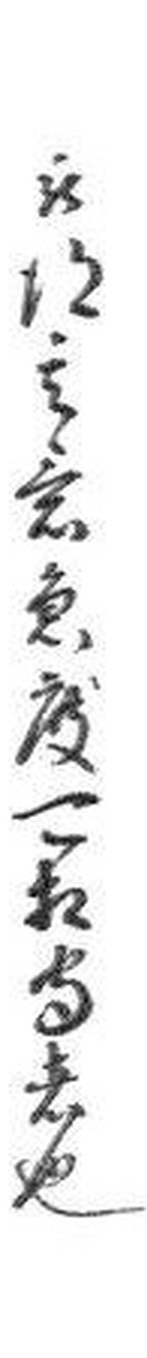被得其意急度可相守者也
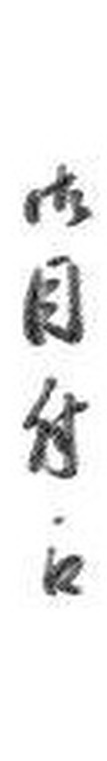御目付江
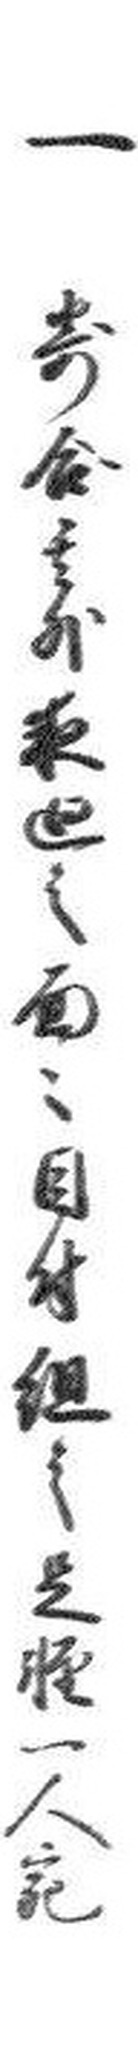一寄合其外夜廻之面々目付組之足軽一人宛
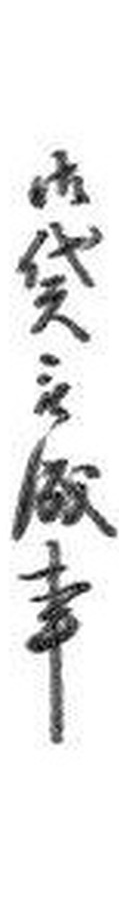御貸被成事
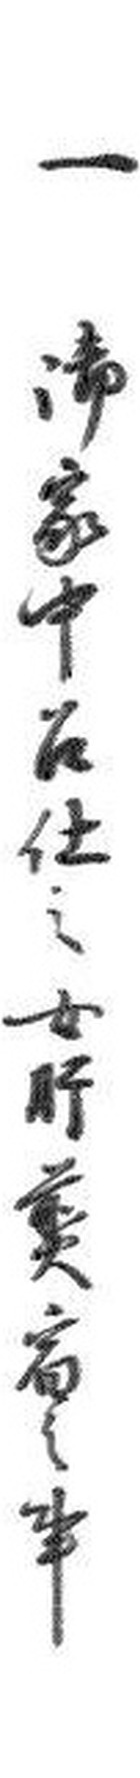一御家中召仕之女肝煎宿之事
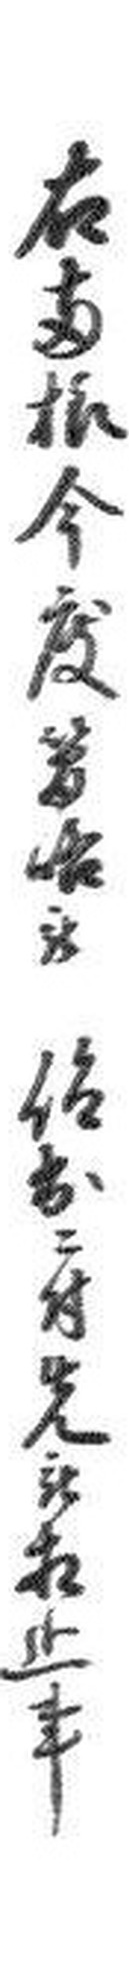右両様今度簡略被仰出ニ付先被相止事
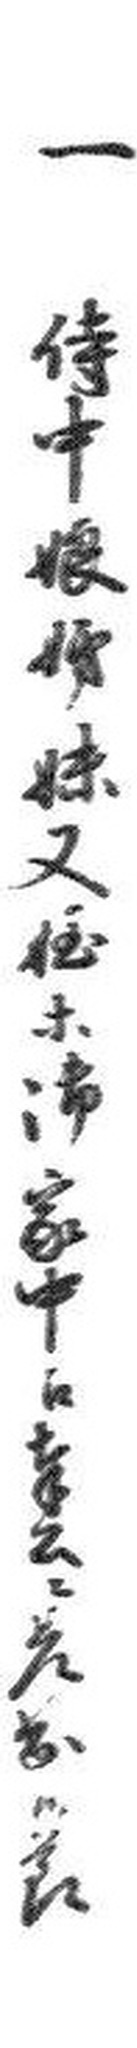一侍中娘姉妹又姪等御家中江奉公ニ差出候節
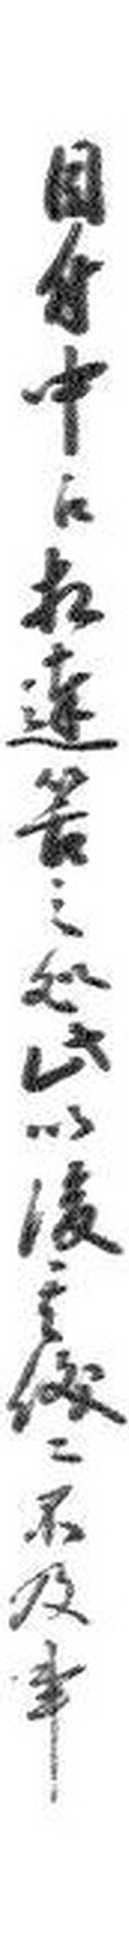目付中江相達筈之処此以後其儀ニ不及事
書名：家譜 二十八 吉邦公 従宝永七年七月五日到正徳元年十二月
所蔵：福井県文書館 Fukui Prefectural Archives
